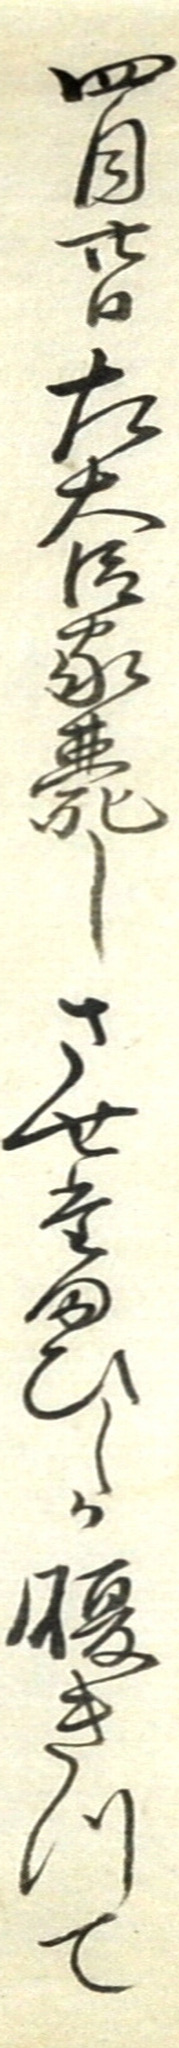四月廿日左大臣家薨しさせたまひしか腹きつて
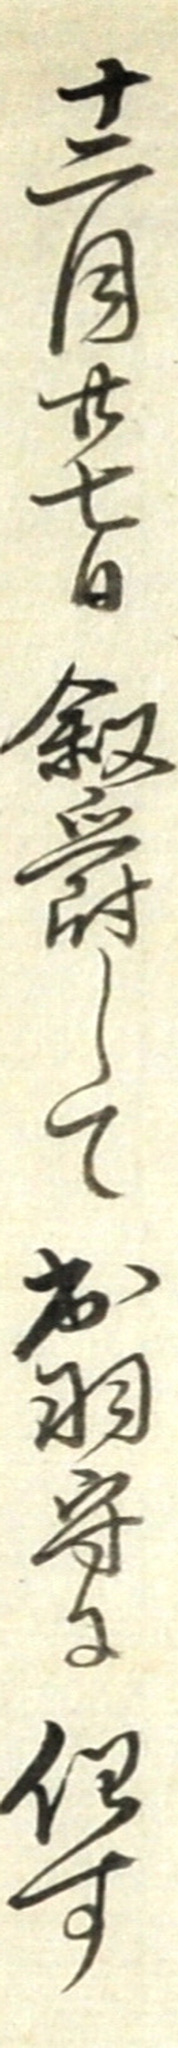十二月廿七日叙爵して出羽守に任す

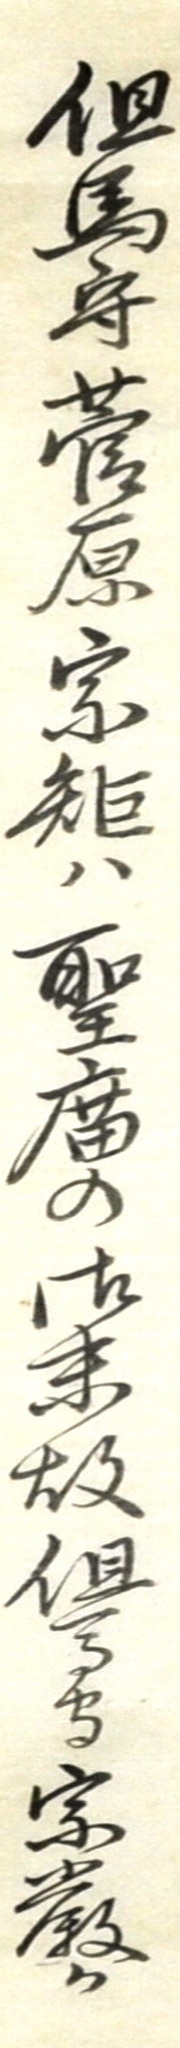但馬守菅原宗矩は聖廟の御末故但馬守宗厳か
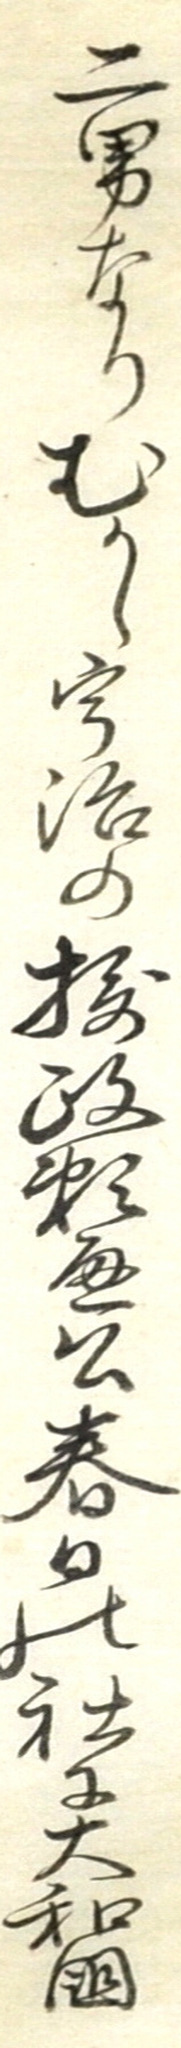二男なりむかし宇治の摂政頼通公春日の社に大和国
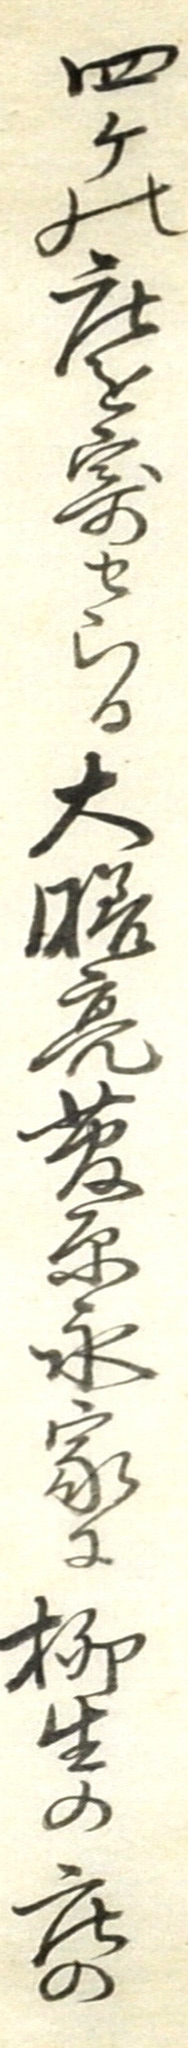四ヶの庄を寄せらる大膳亮菅原永家に柳生の庄の
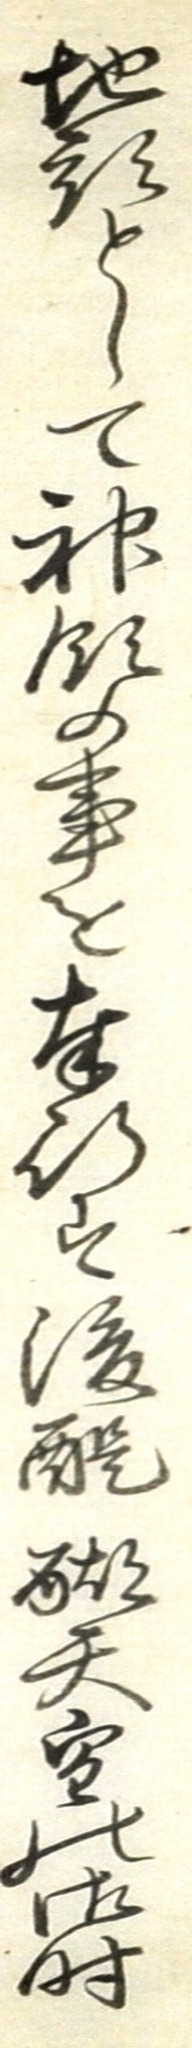地頭として神領の事を奉行す御醍醐天皇の御時
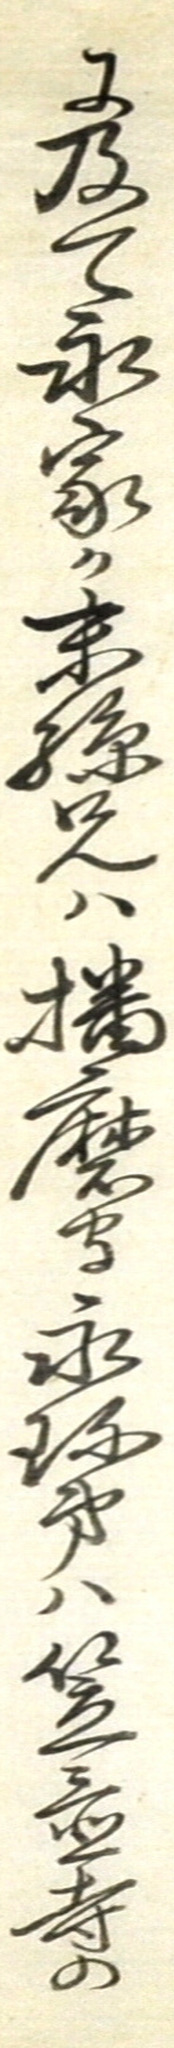に及て永家か末孫兄は播磨守永珍弟は笠置寺の
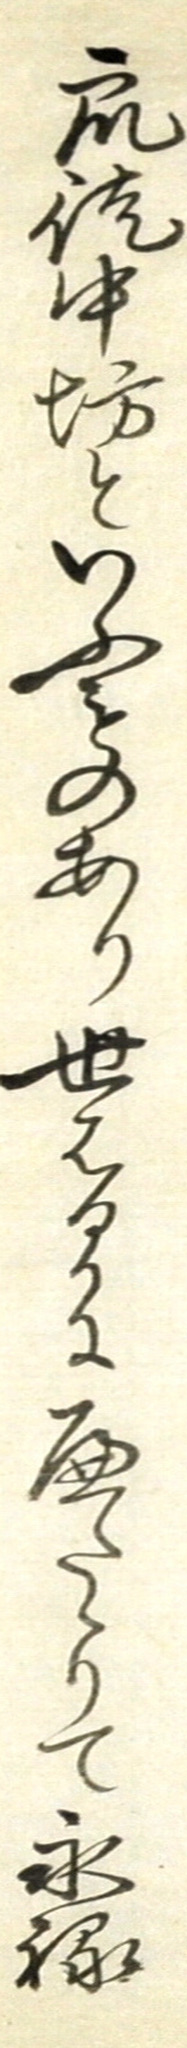衆徒中坊といふものあり世はるかにへたゝりて永禄
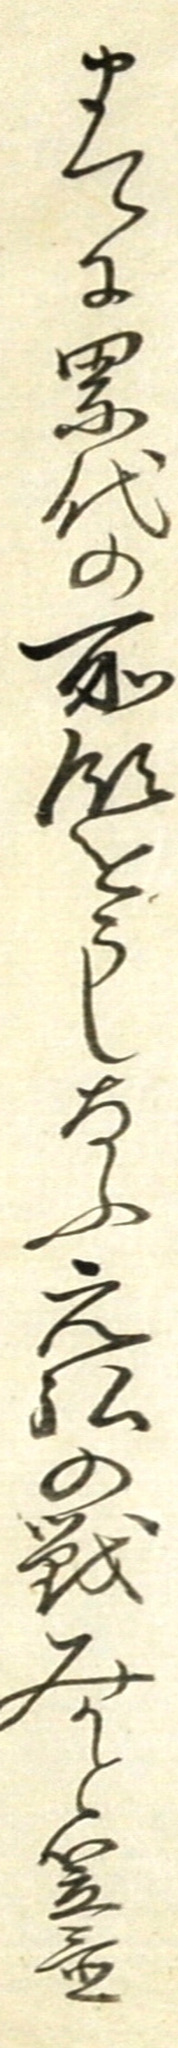まてに累代の所領をうしなふ元弘の戦みかと笠置

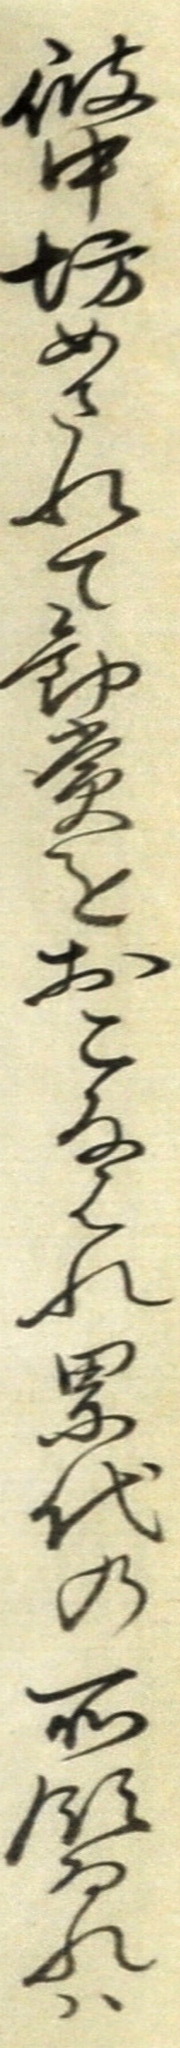彼中坊めされて勧賞をおこなはれ累代の所領なれは
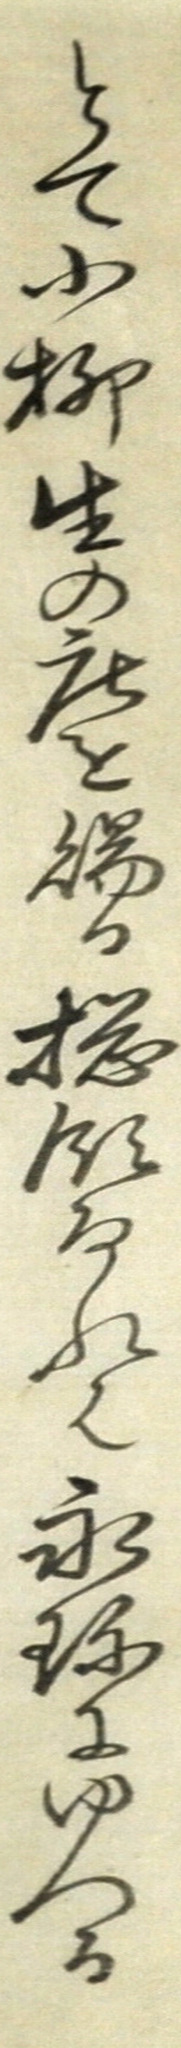とて小柳生の庄を賜る総領なれは永珍にゆつる
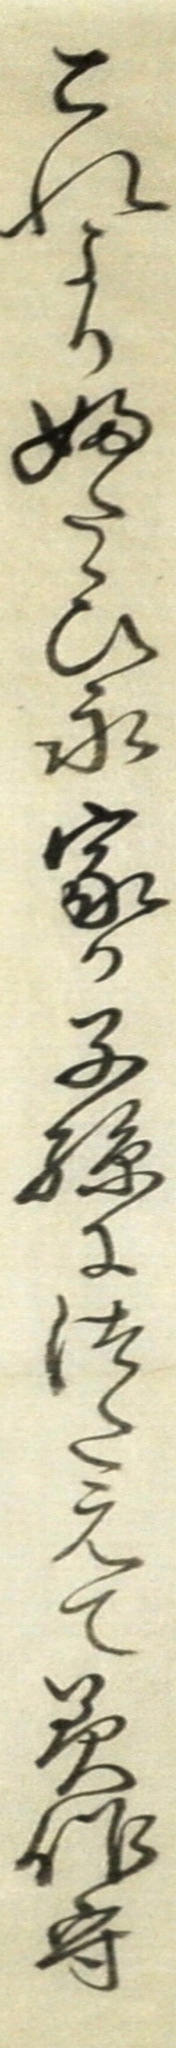これよりふたゝひ永家か子孫につたえて美作守
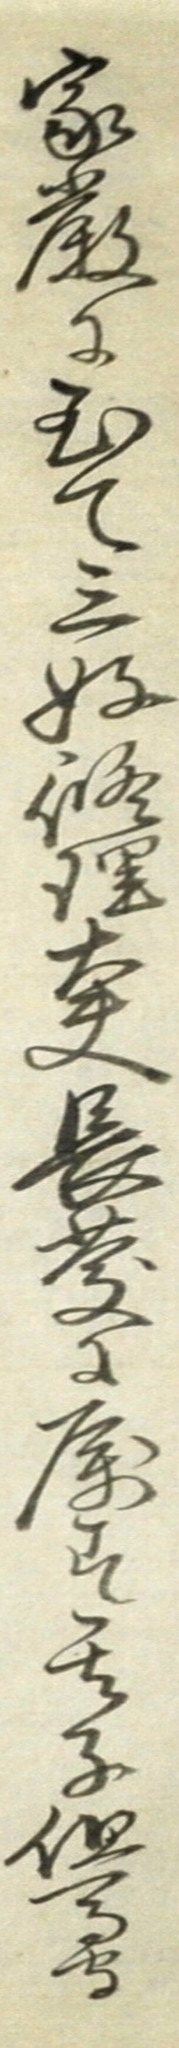宗厳に至て三好修理大夫長慶に属す其子但馬守
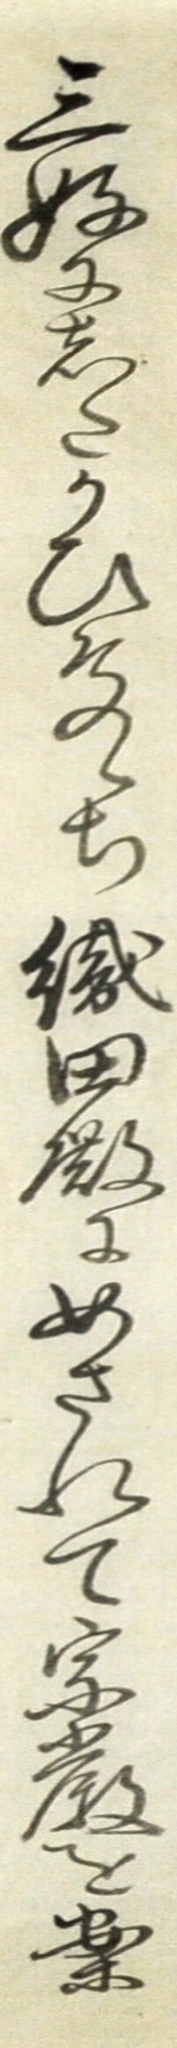三好にしたかひそのゝち織田殿にめされて宗厳を案
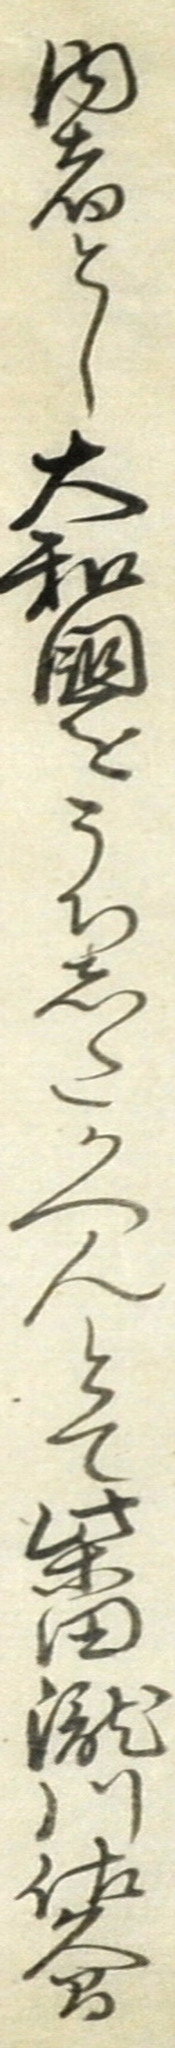内者とし大和国をうちしたかへんとて柴田滝川佐久間
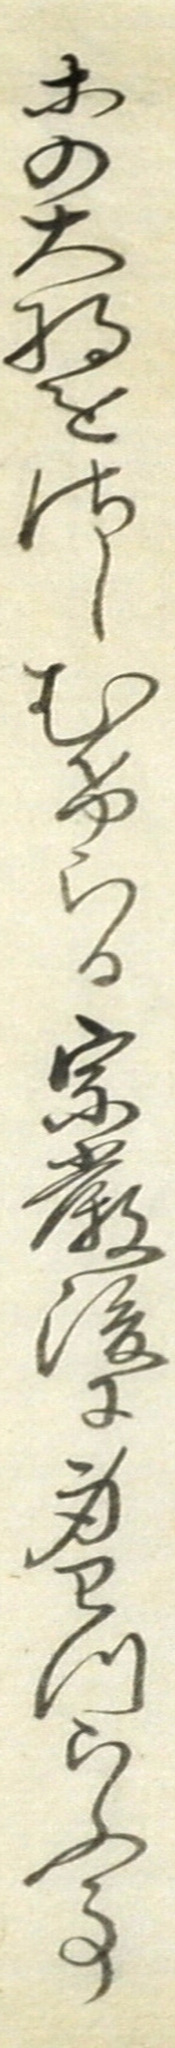等の大将をさしむけらる宗厳後に身わつらふ事
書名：藩翰譜（六）
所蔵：伊那市立高遠町図書館・合同会社AMANE
